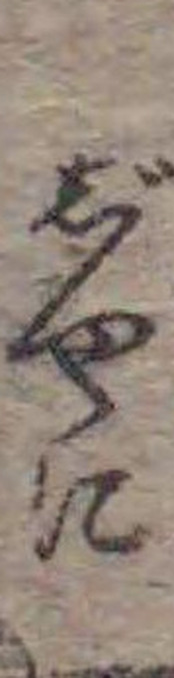じやに
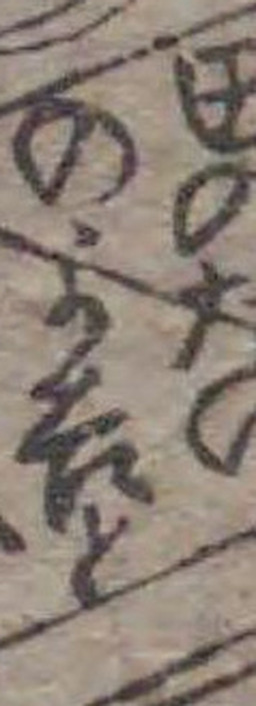の与吉と

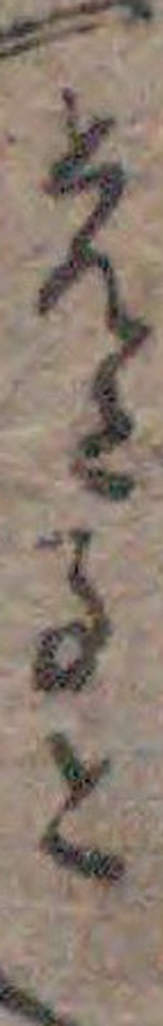とんた事と
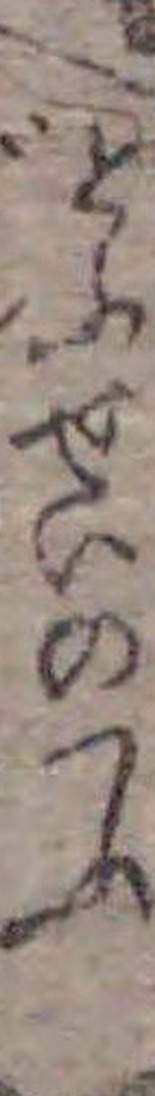とふせいのつふ
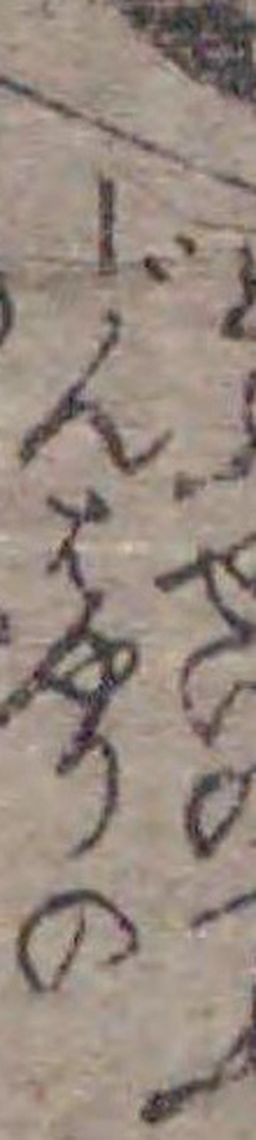じんはやりの
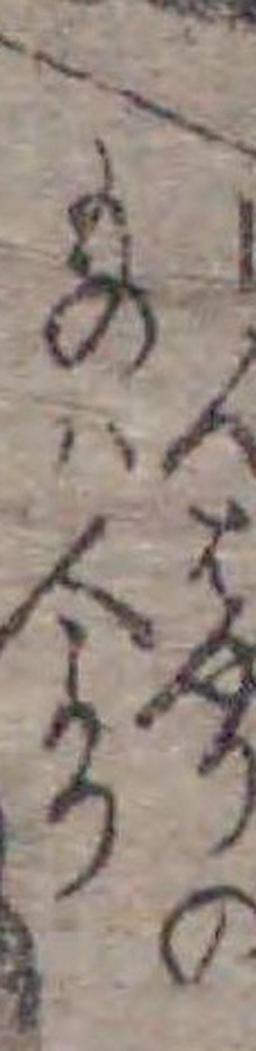ものは人より
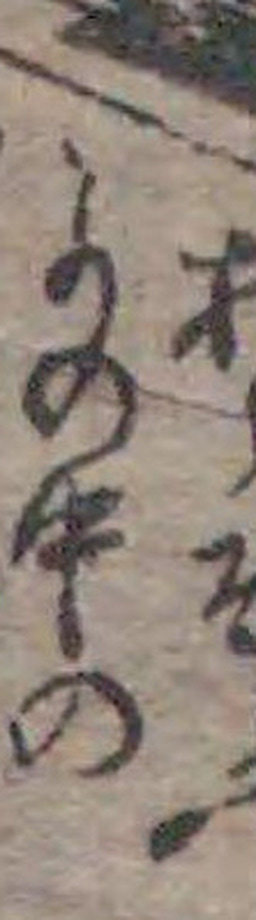よの中の
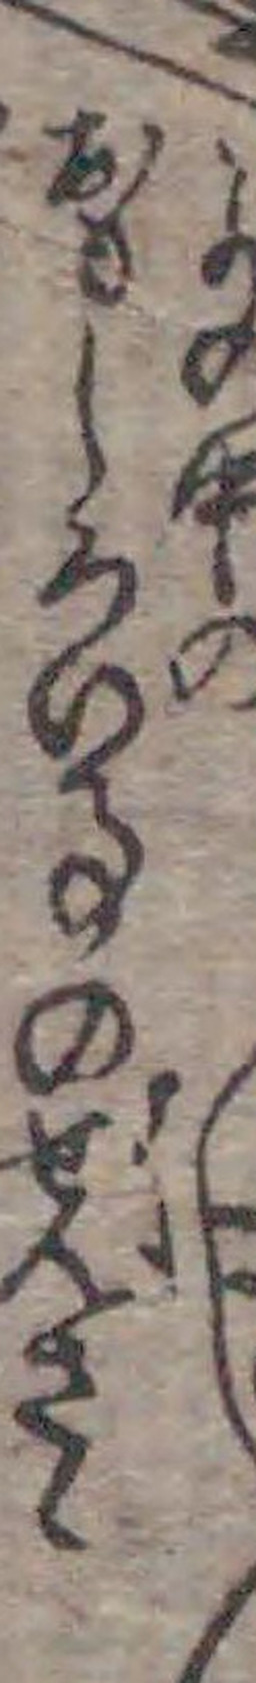おもしろい事のせんさく
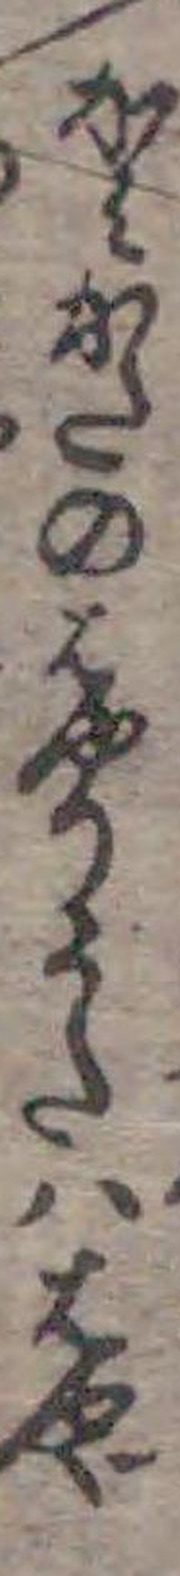かみかたのはやりうたははや
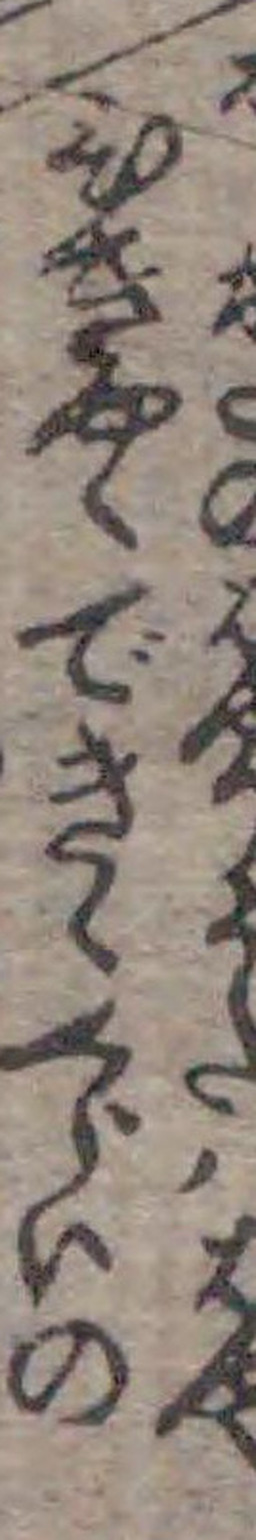ひきやくできくくらいの
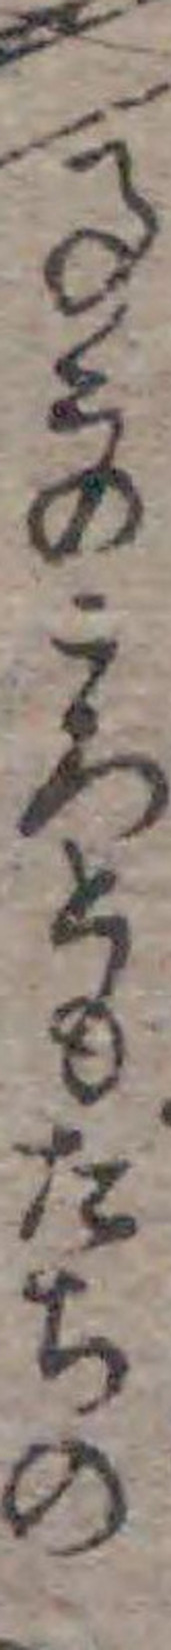事このころともたちの
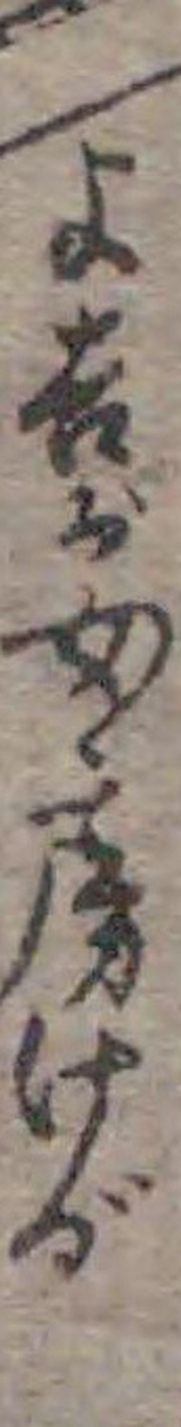与吉か女房けが
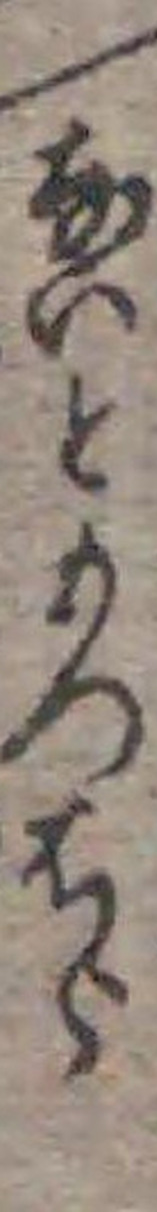ないともつはら
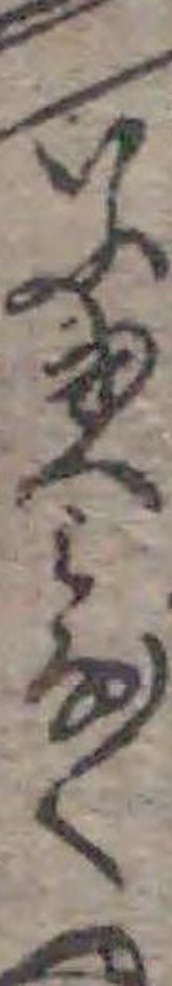いふゆへみな〳〵
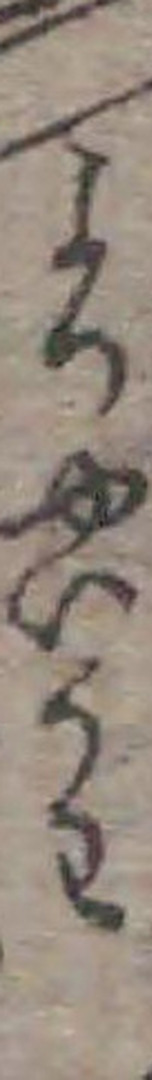よりやいうわ
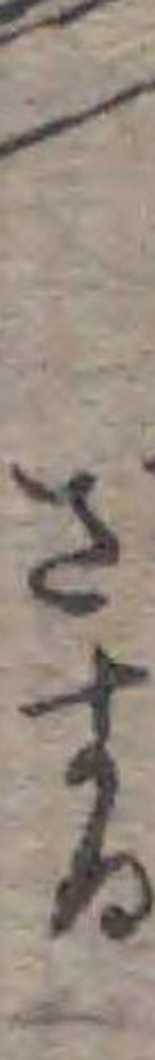さする
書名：神田与吉一代記 : 3巻
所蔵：国立国会図書館 National Diet Library, JAPAN
